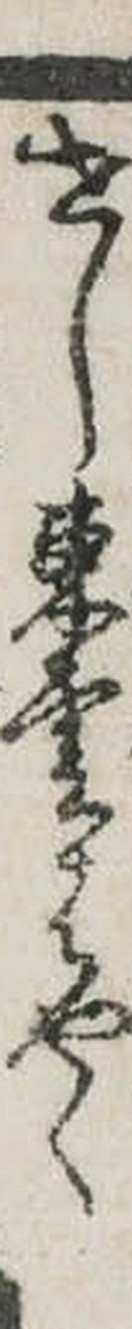せし東雲はやく
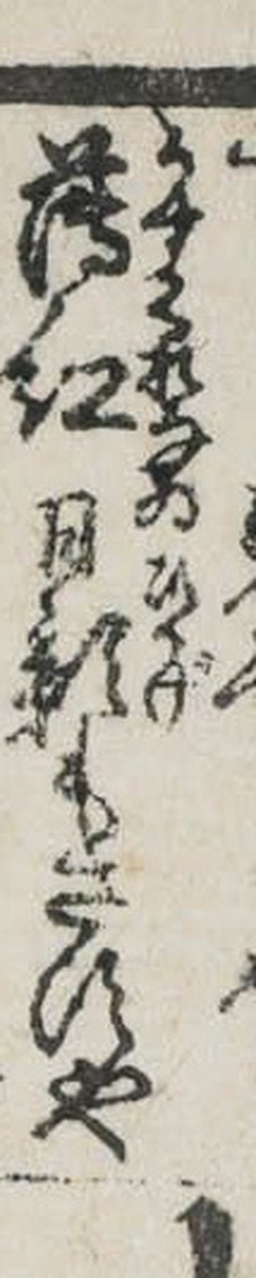薄紅日影もさすや
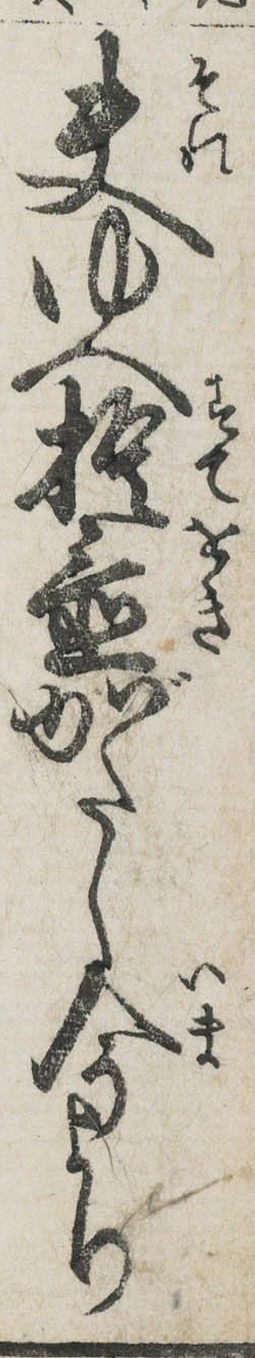夫ゆへ捨置がたし今より
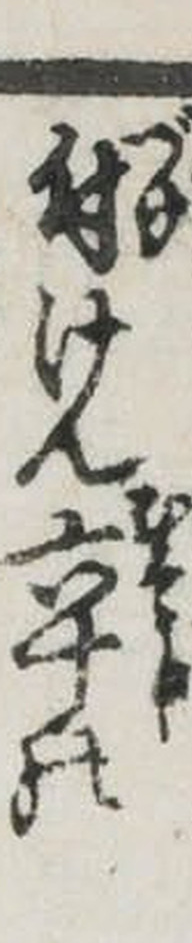付けん六十の
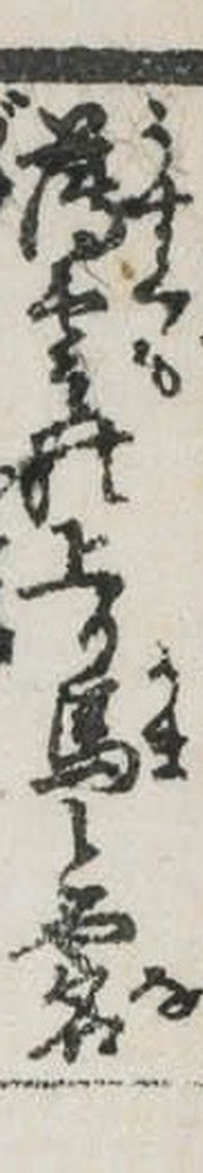薄雲の上り馬とや名
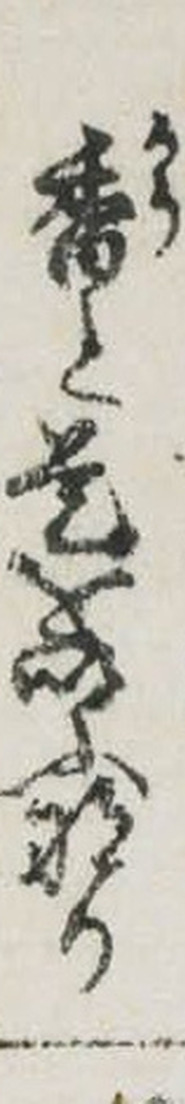香と是をいふなり
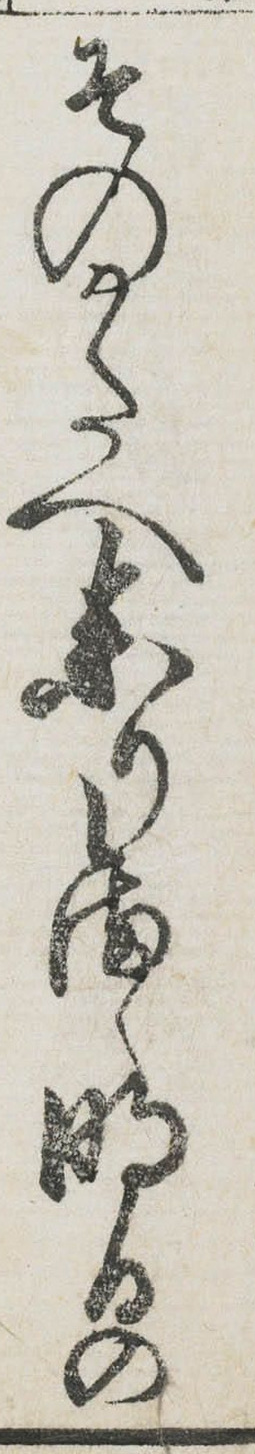そのかたへ参り候まゝ明日の
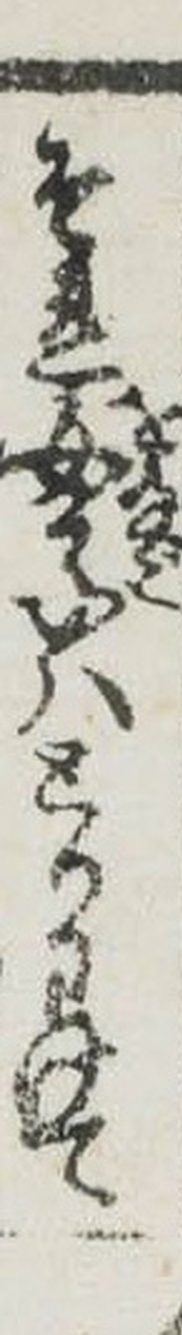それ女子はとりわけて
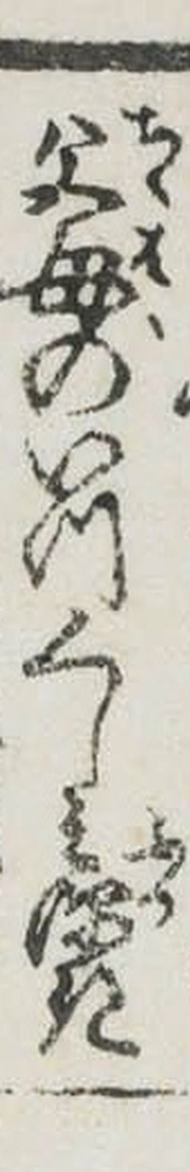父母のいつくしみ深き
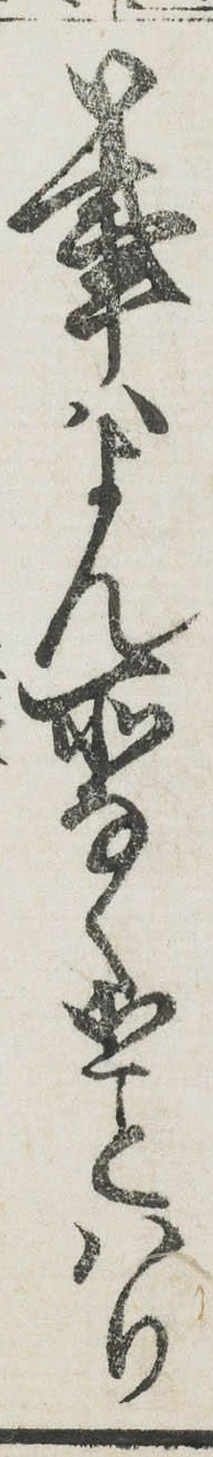御事はよん所なく御ことはり
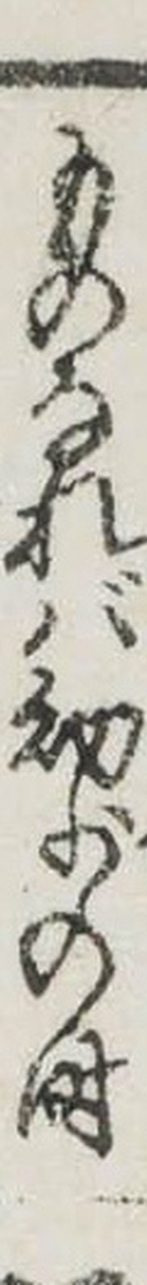ものなれば幼少の時
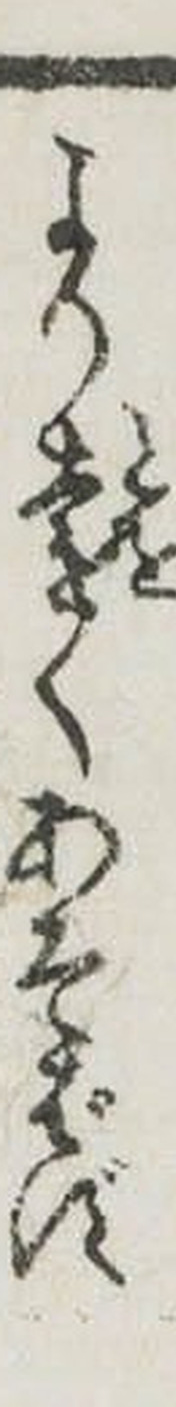より遠くあそばず
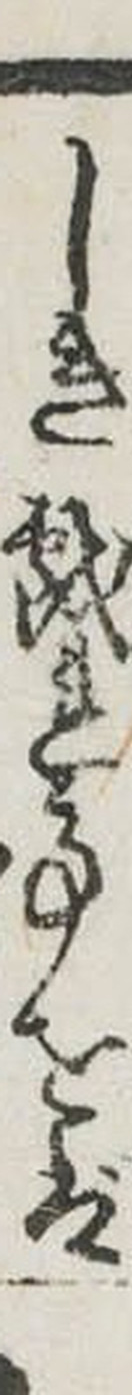しき戯れ事をば
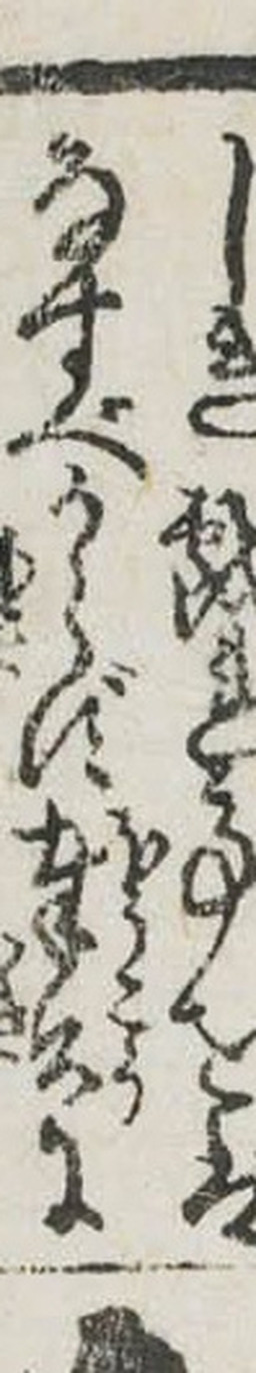なすべからず奉公に
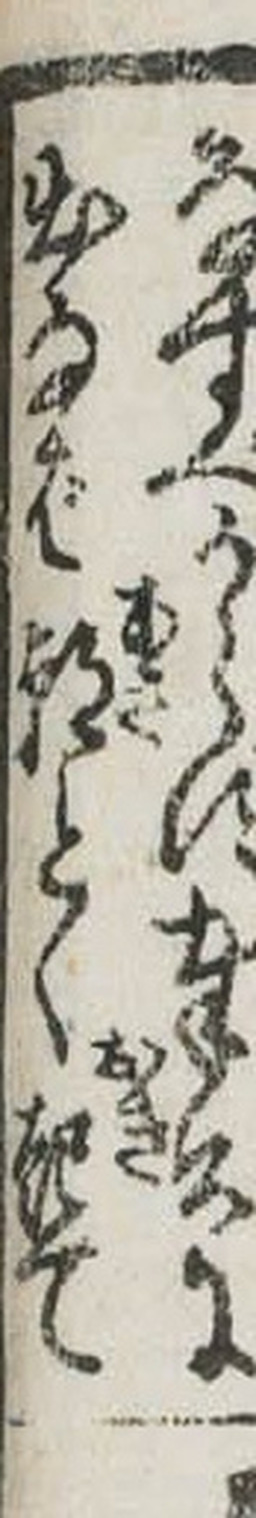出なば朝とく起て
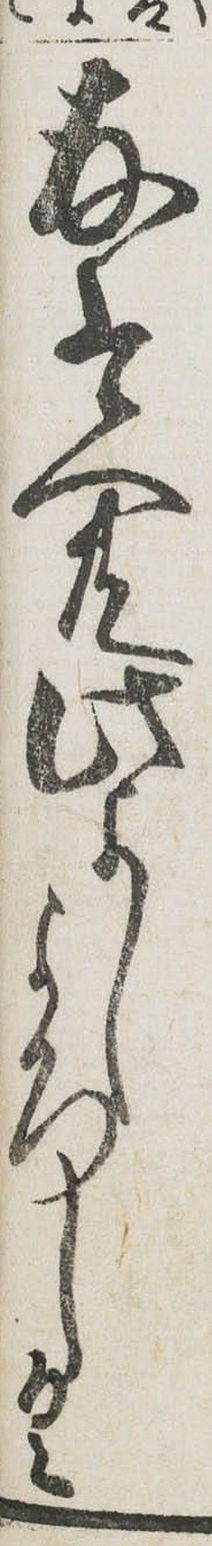存上候へ共此よしよろしく
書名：頭書萬用婦人手紙之文言
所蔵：東京学芸大学教育コンテンツアーカイブ
